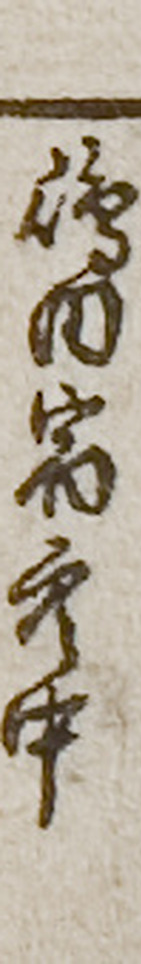嶋田宿空中
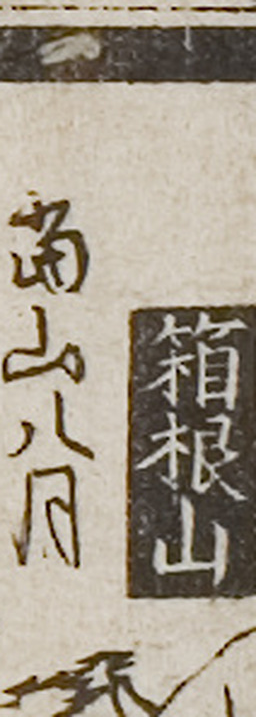当山八月
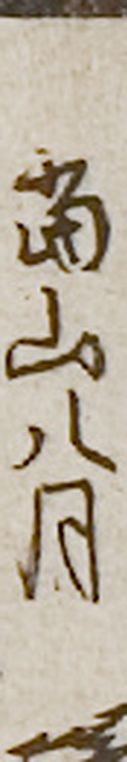当山八月
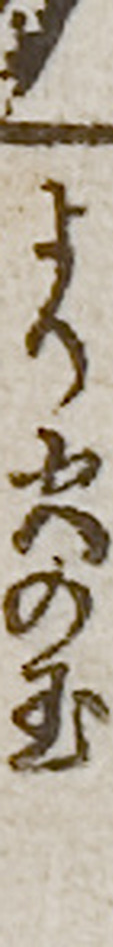より火の玉
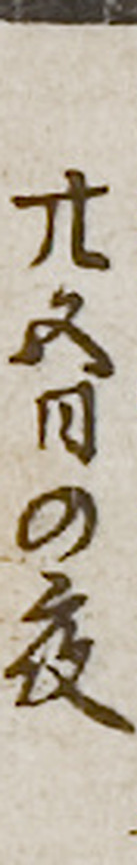廿五日の夜
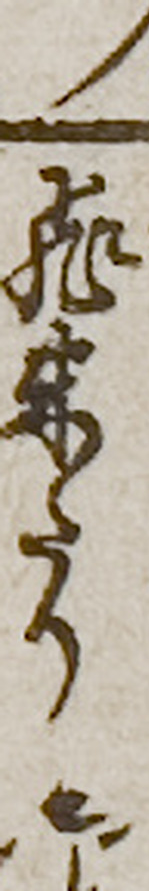飛来たり
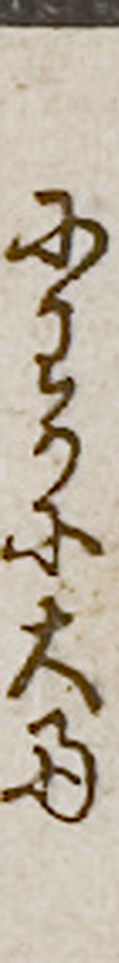にわかに大雨
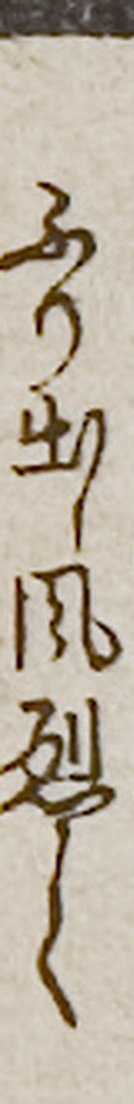ふり出し風烈しく
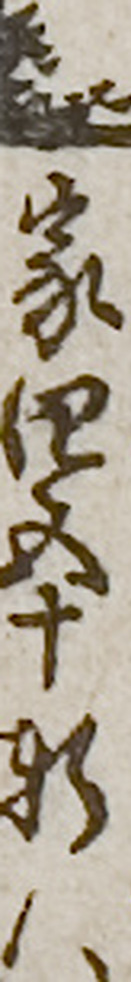家四五十軒
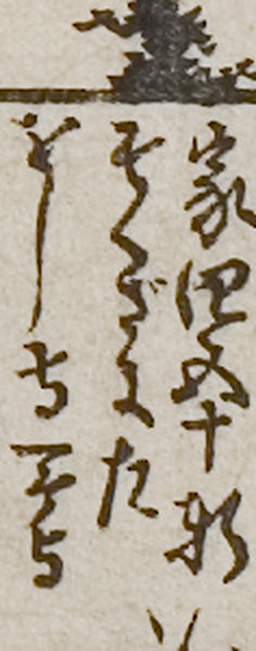そくざにた
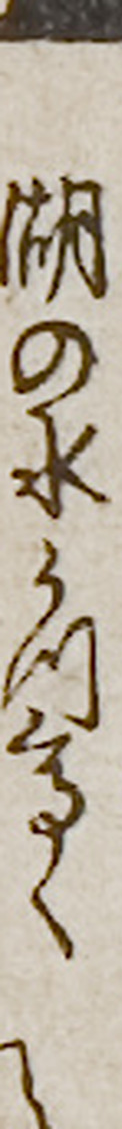湖の水うつ高く
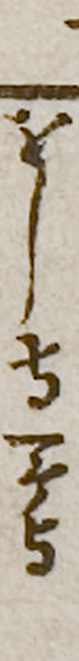をし寺一ヶ寺
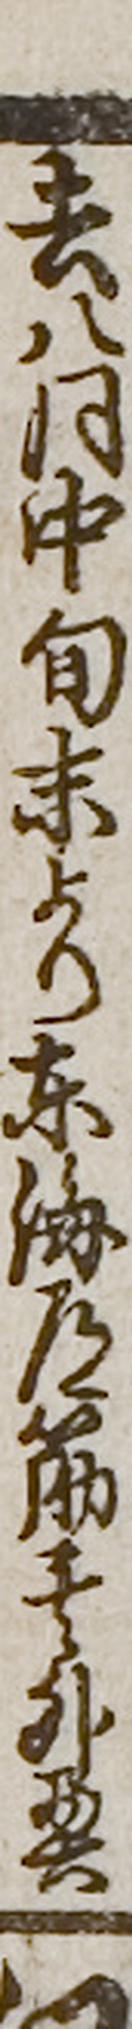去八月中旬末より東海道筋其外奥
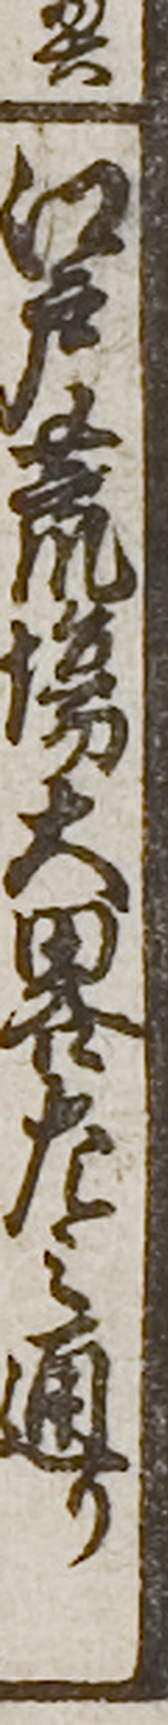江戸荒場大略左之通り
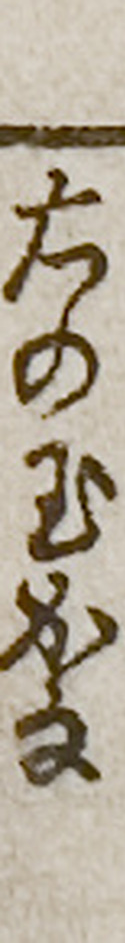右の玉かな
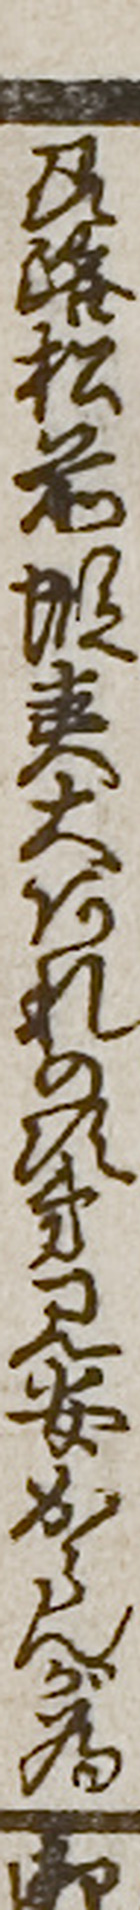州路松前蝦夷大あれの次第見安からんが為
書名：江戸東海道東国荒珍事図
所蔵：東京大学総合図書館 General Library in the University of Tokyo, JAPAN
